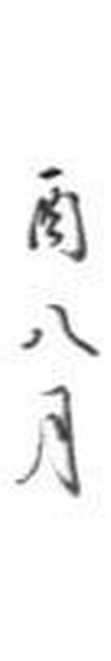酉八月
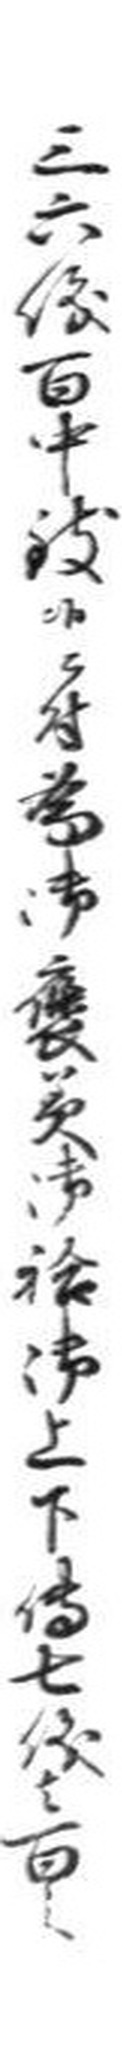三六儀百中致候ニ付為御褒美御袷御上下伝七儀者百之
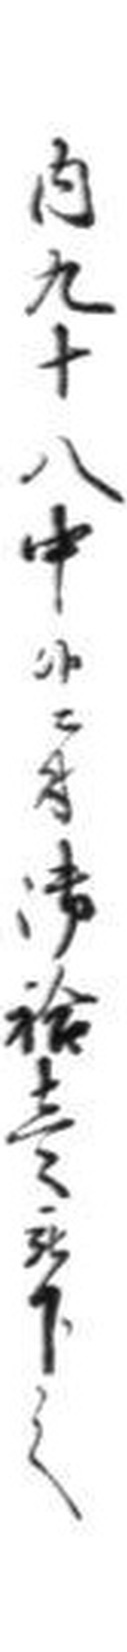内九十八中候ニ付御袷壱被下之
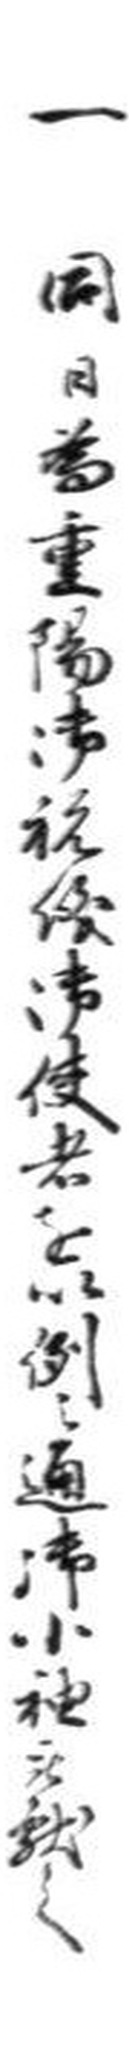一同日為重陽御祝儀御使者を以例之通御小袖被献之
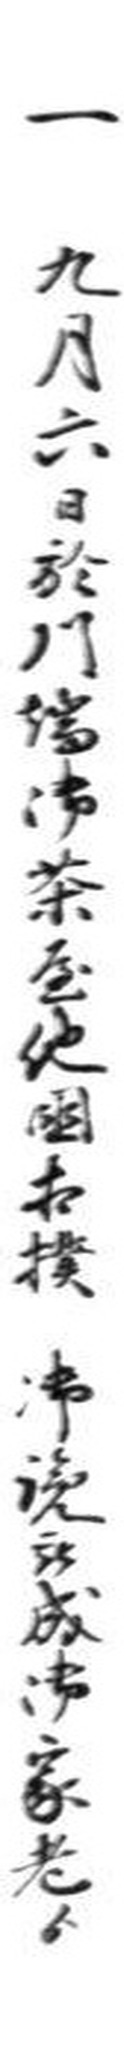一九月六日於川端御茶屋他国相撲御覧被成御家老ゟ
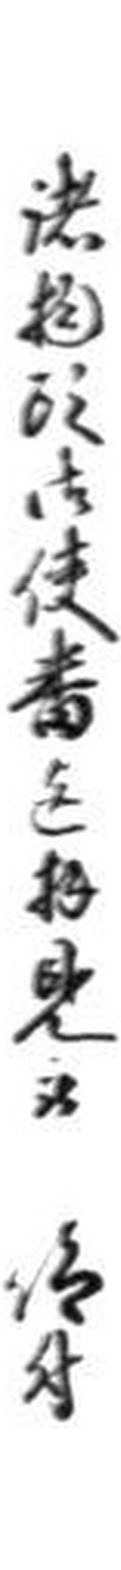諸物頭御使番迄拝見被仰付
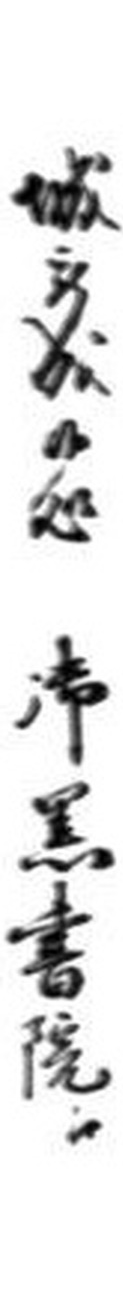城被成候処御黒書院江
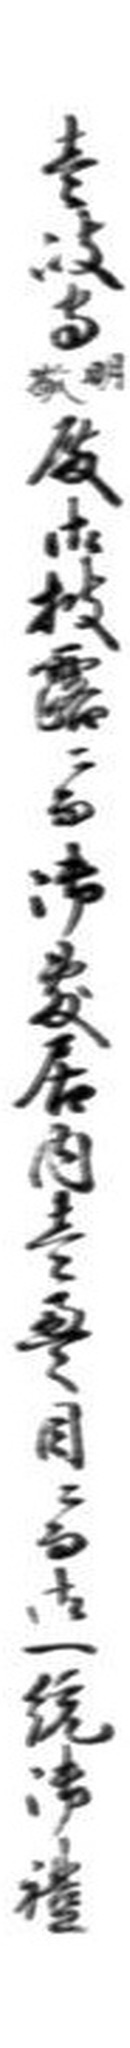敬殿御披露ニ而御敷居内壱畳目ニ而御一統御礼
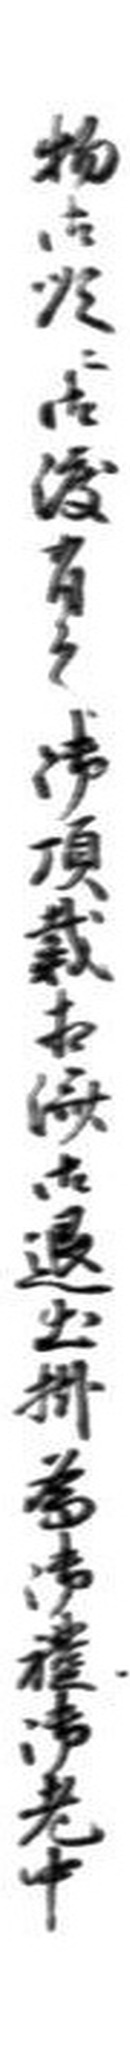物御順ニ御渡有之御頂戴相済御退出掛為御礼御老中
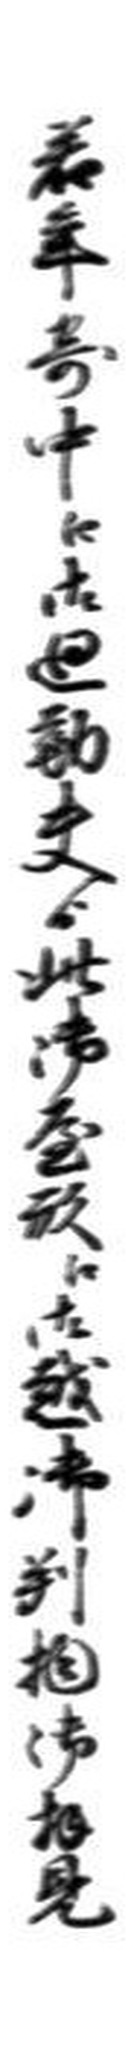若年寄中江御廻勤夫ゟ此御屋形江御越御判物御拝見
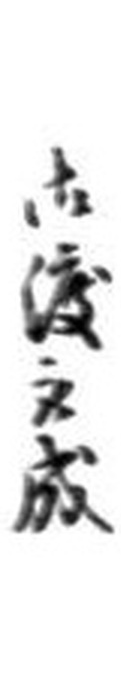御渡被成

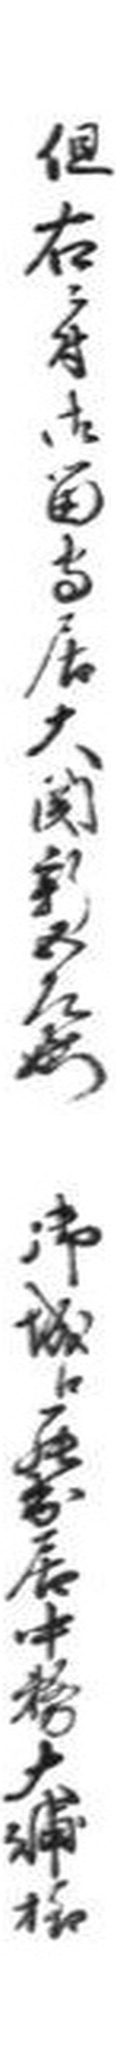但右ニ付御留守居大関新五左衛門御城江罷出居中務大輔様
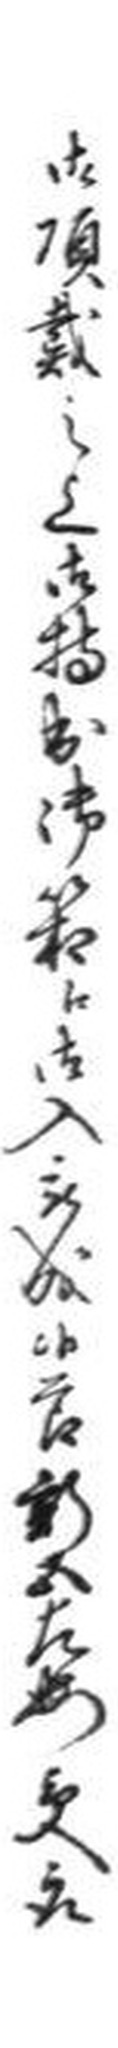御頂戴之上御持出御箱江御入被成候節新五左衛門受取
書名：家譜 三十二 吉邦公 従享保二年到享保三年
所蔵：福井県文書館 Fukui Prefectural Archives
